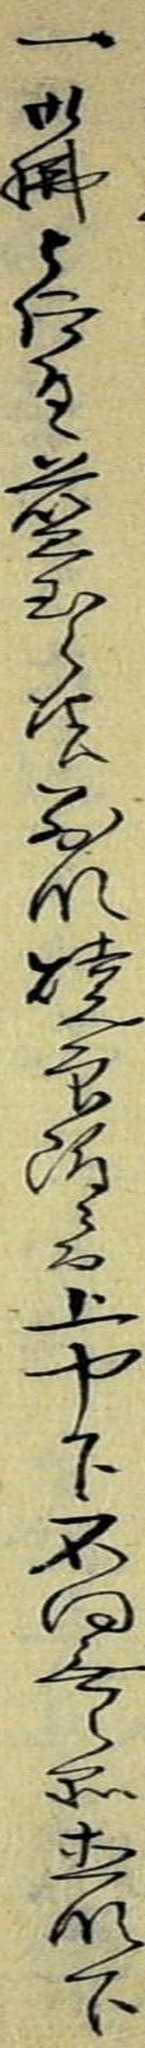一御払被仰付候藍玉之儀は別段焼印附に而上中下不同無之品直段下
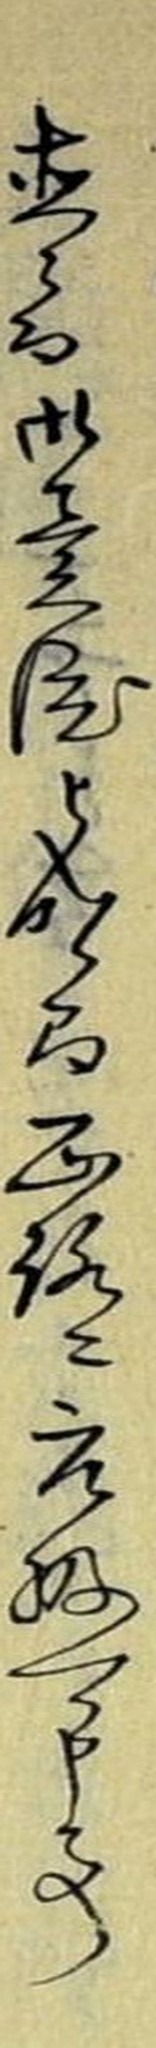直に而御売渡被成候間正路に取扱可申事
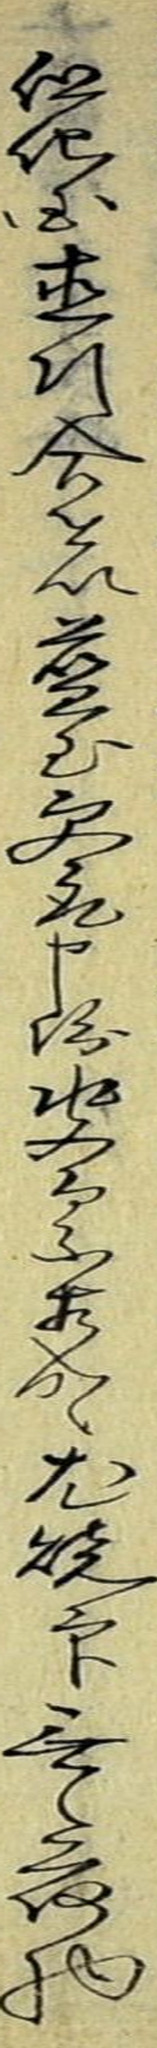但他国直引合を以藍玉受取申儀決而不相成候尤焼印無之荷物
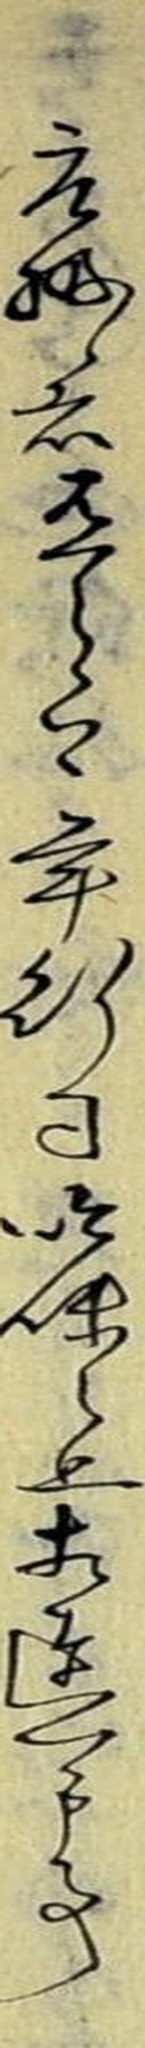取扱候者有之候はヽ年行司吟味之上相達可申事
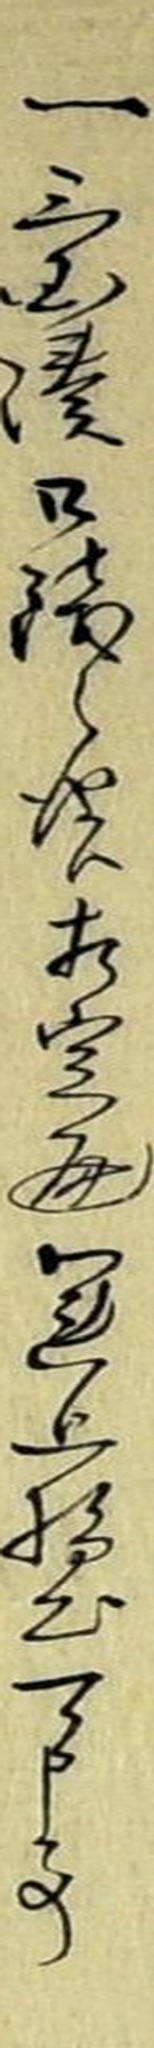一三国湊口銭之儀は相定通運上指出可申事
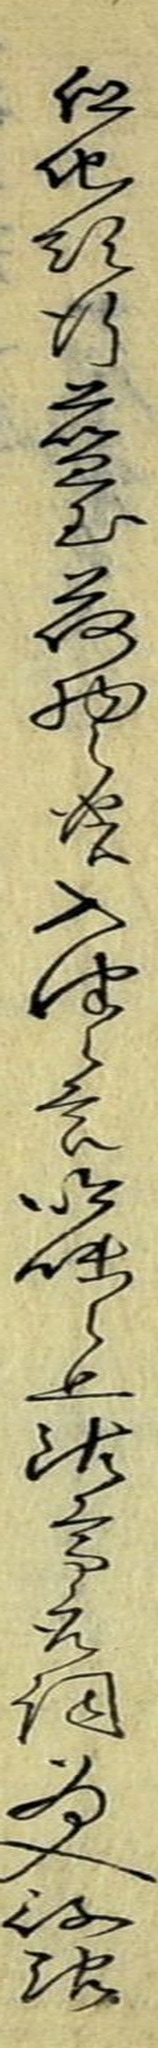但他領行藍玉荷物之儀は入津候節吟味之上銀高取調為入役銀
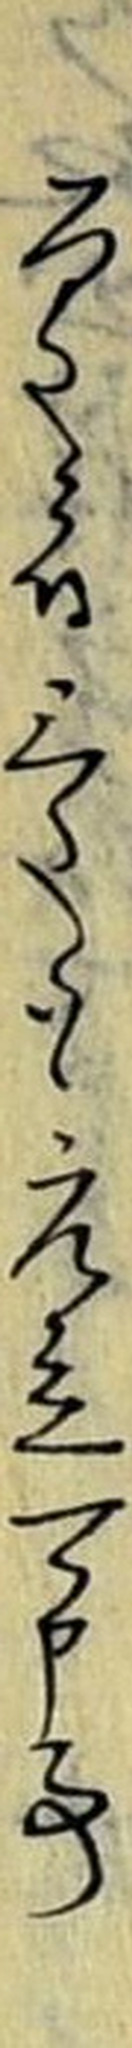百匁に付三匁つヽ取立可申事
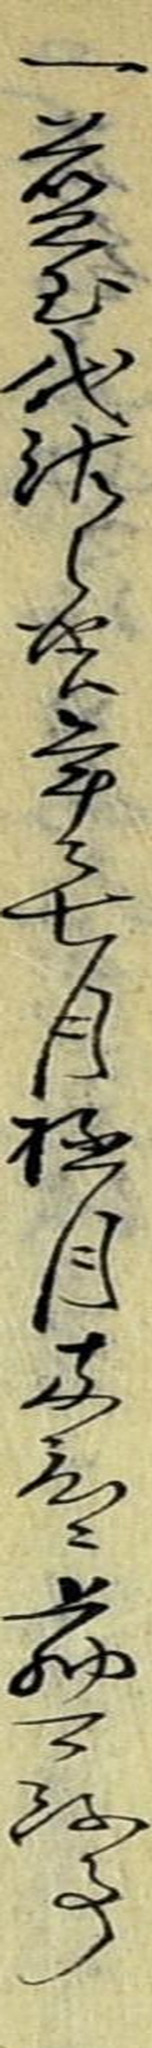一藍玉代銀之儀は年々七月極月両度に上納可致事
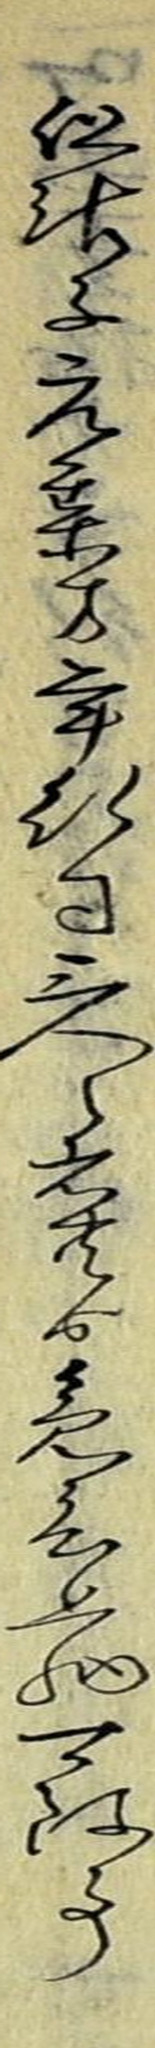但銀子取集方年行事三人之者共ゟ急度上納可致事
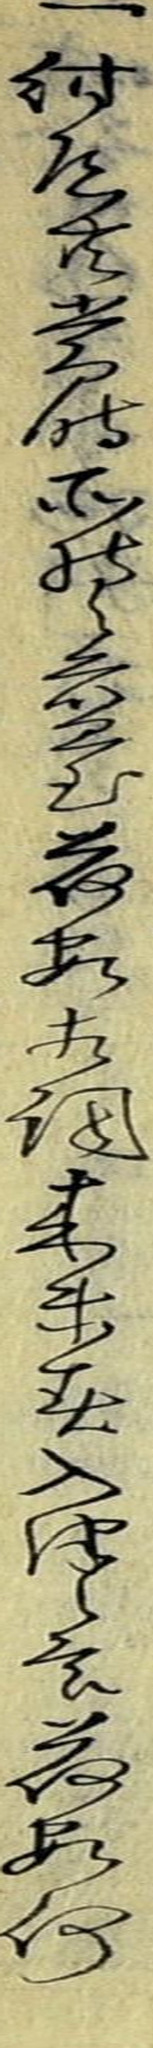一紺屋共当時所持之藍玉荷物相調来未春入津之節荷数何
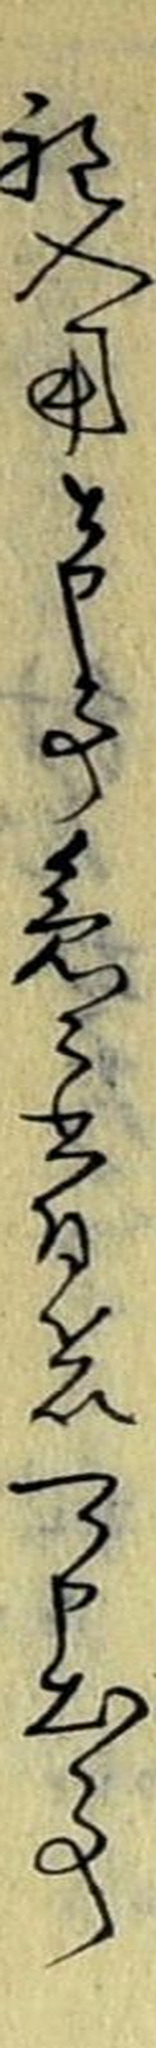程入用と申事兼々書付を以可申出事
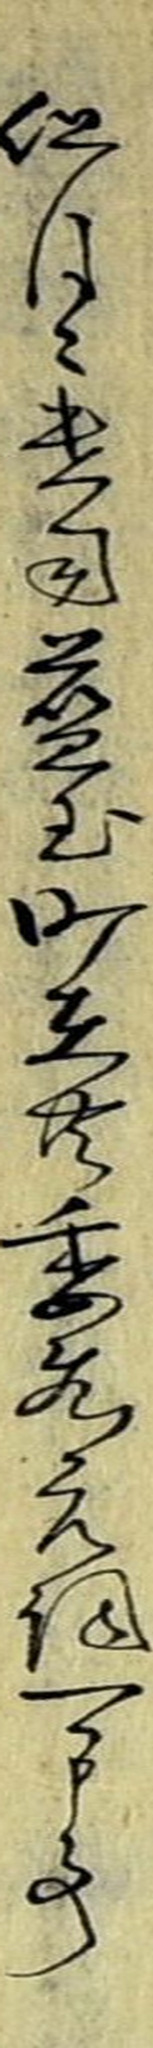但月々遣用藍玉町在共委敷取調可申事
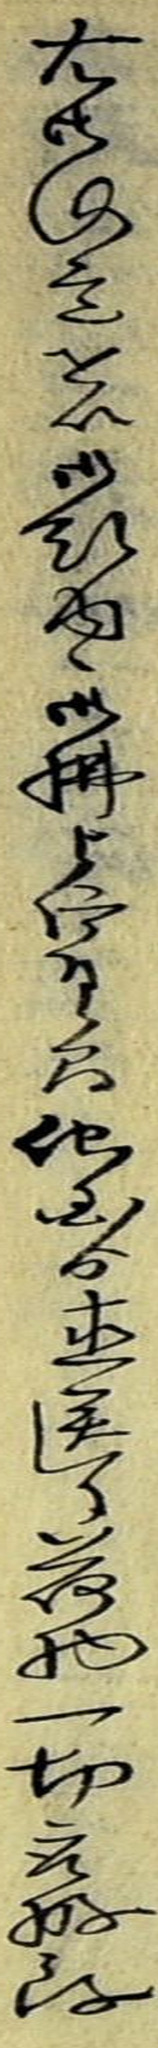右御趣意を以御領内へ御払被仰付候間他国ゟ直送り荷物一切取扱致

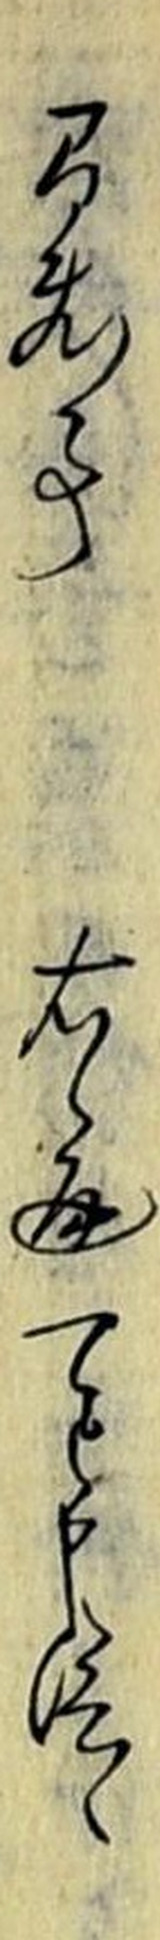間敷事右之通可被申渡候
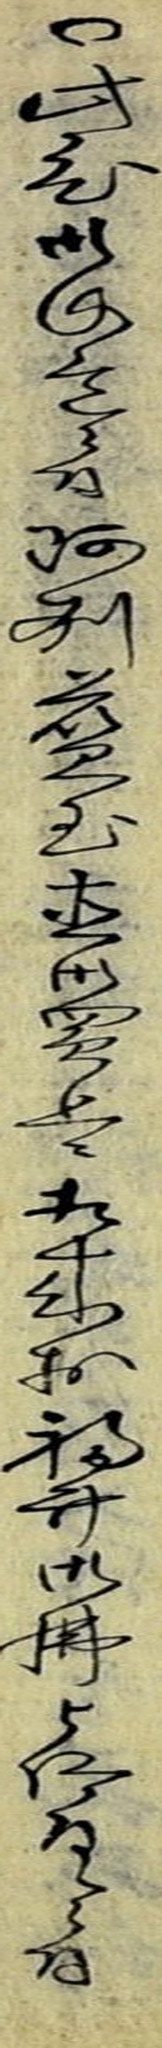○此度御趣意に付阿州藍玉直御買上に相成於福井御払被仰付候に付
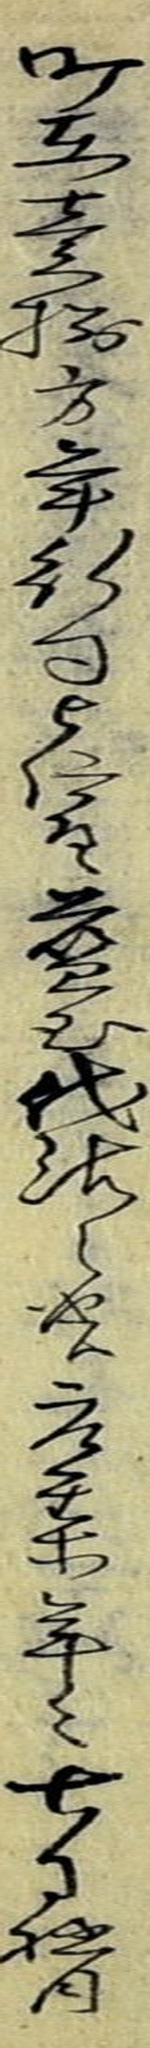町在売捌方年行事被仰付候藍玉代銀之儀は取集等年々七月極月
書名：命令之部 四
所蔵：福井県文書館 Fukui Prefectural Archives
